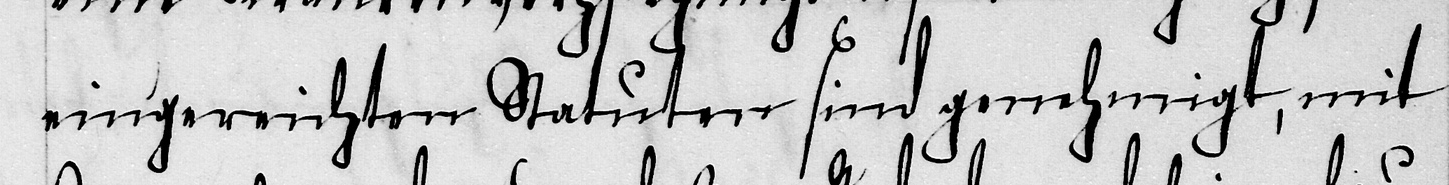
eingereichten Statuten sind genehmigt, mit
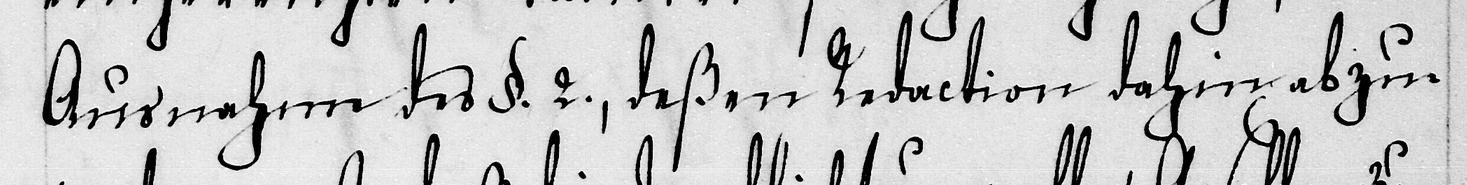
Ausnahme des §. 2., deßen Redaction dahin abzu¬
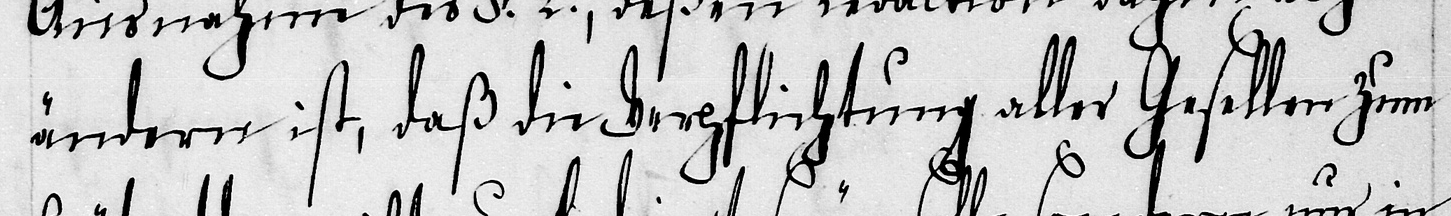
ändern ist, daß die Verpflichtung aller Gesellen zum
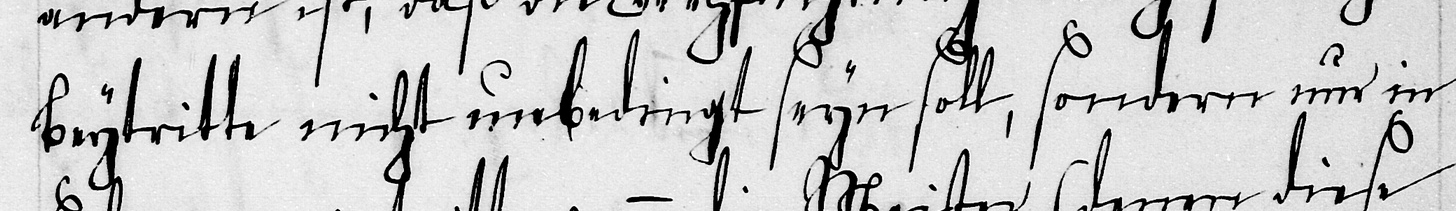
Beytritte nicht unbedingt seyn soll, sondern nur in
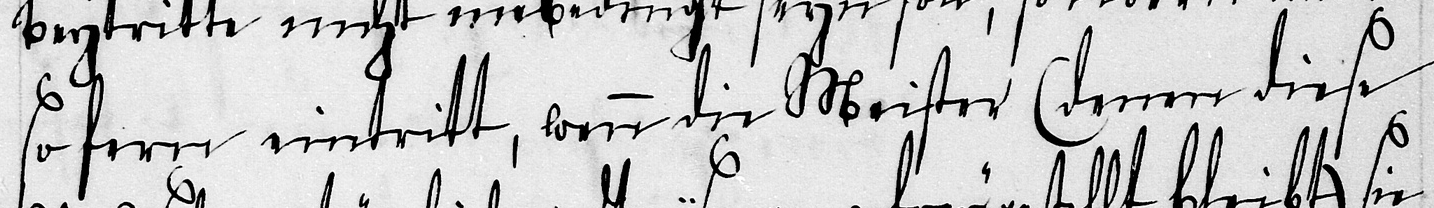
so fern eintritt, wenn die Meister (denen diese
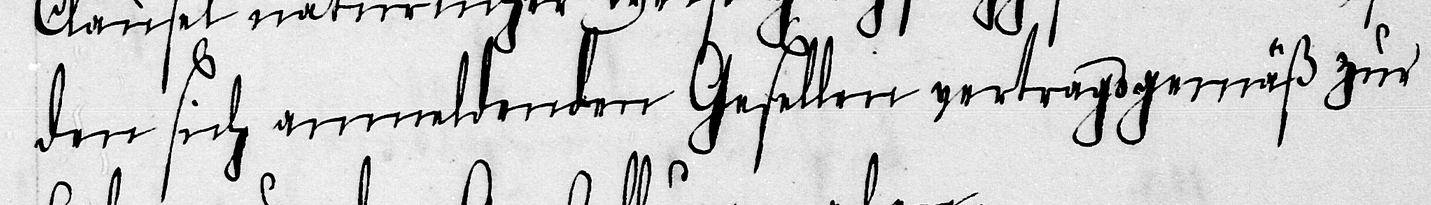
den sich anmeldenden Gesellen vertragsgemäß zur
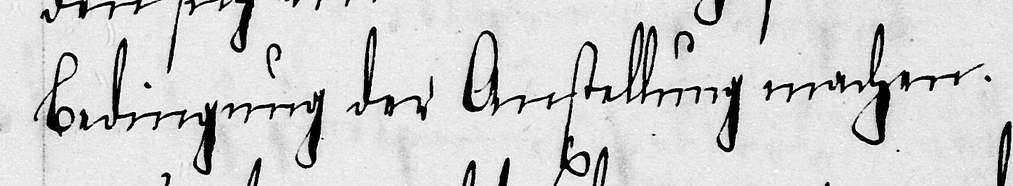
Bedingung der Anstellung machen.
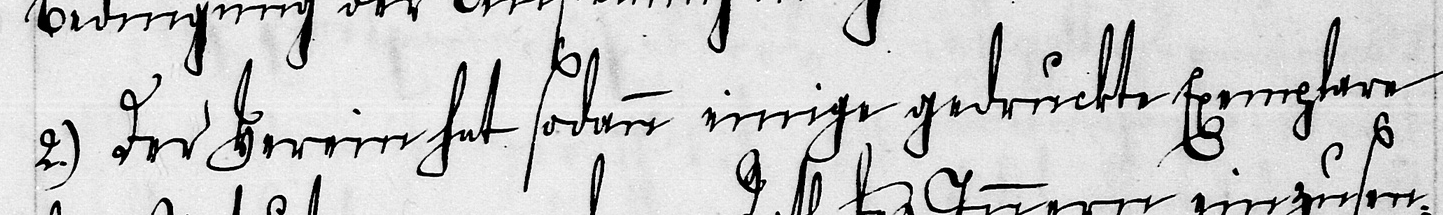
2.) Der Verein hat sodann einige gedruckte Exemplare
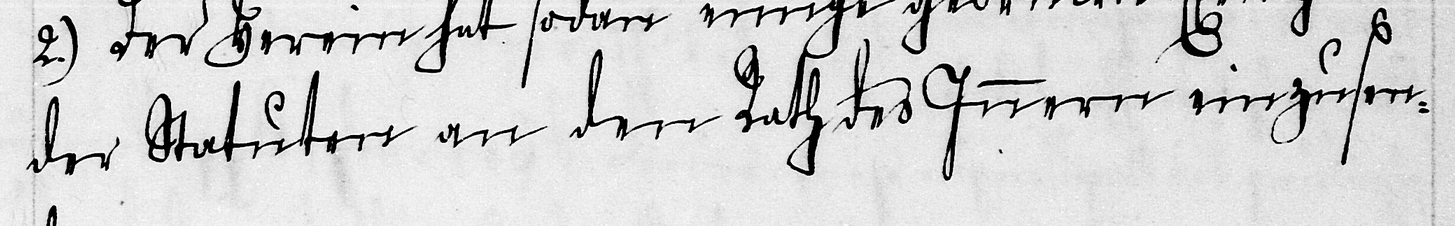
der Statuten an den Rath des Innern einzusen¬
